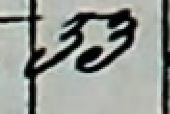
53
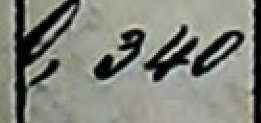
0,340
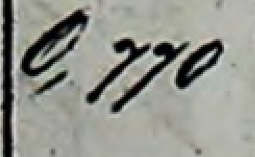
0,770
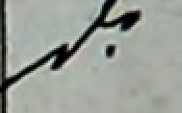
do
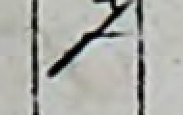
7
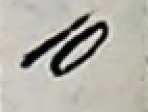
10
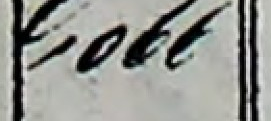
0,066
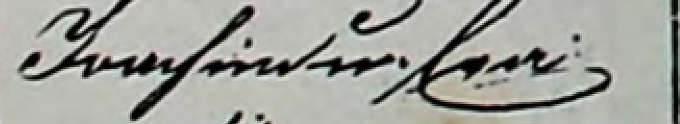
Joachim u. Eva
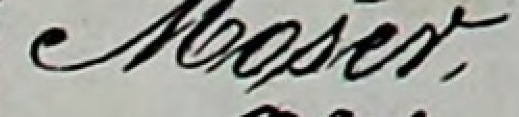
Moser,
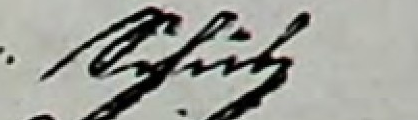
Schütz
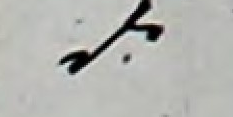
do
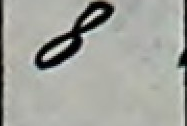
8
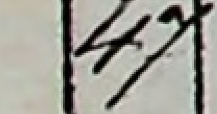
47
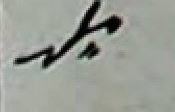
do
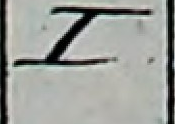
I
